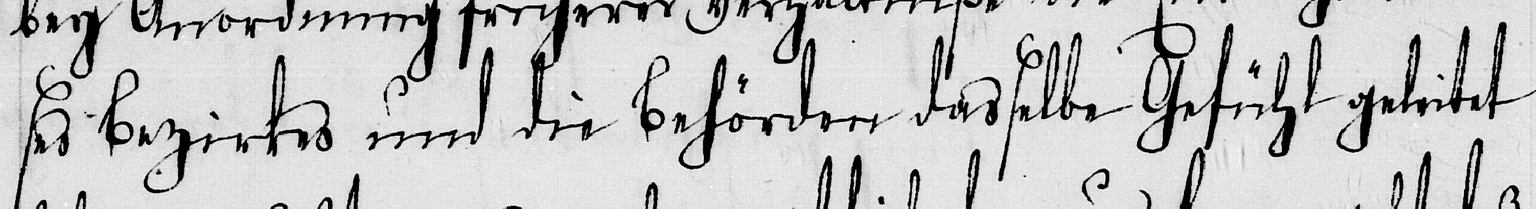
ses Bezirkes und die Behörden dasselbe Gefühl geleitet
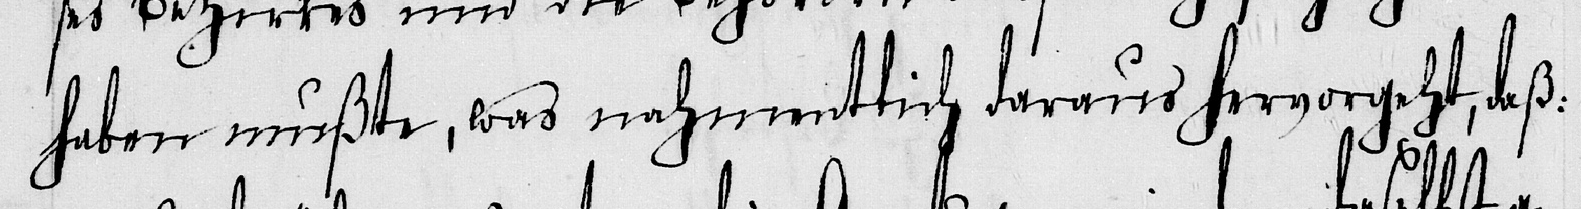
haben mußte, was nahmentlich daraus hervorgeht, daß:
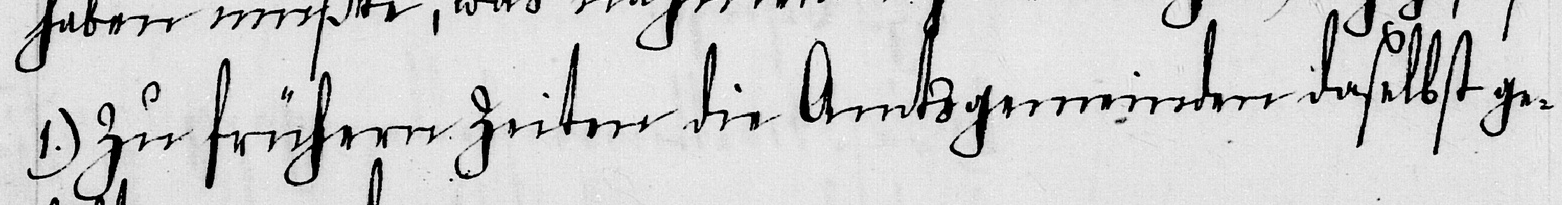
1.) Zu frühern Zeiten die Amtsgemeinden daselbst ge¬
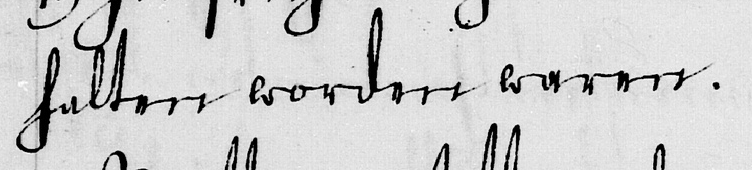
halten worden waren.
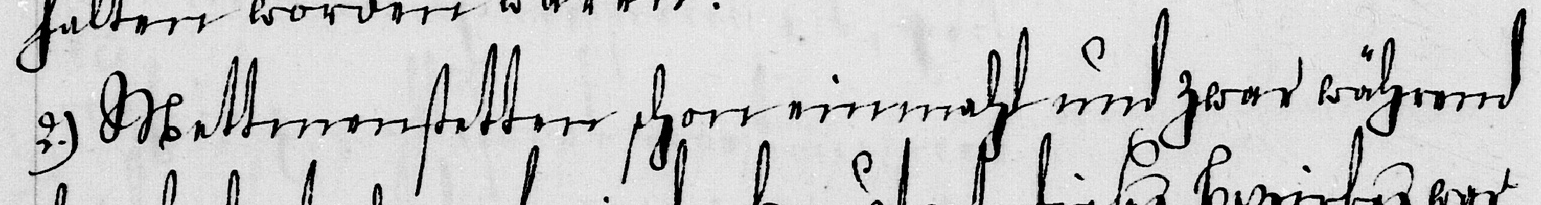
2.) Mettmenstetten schon einmahl und zwar während
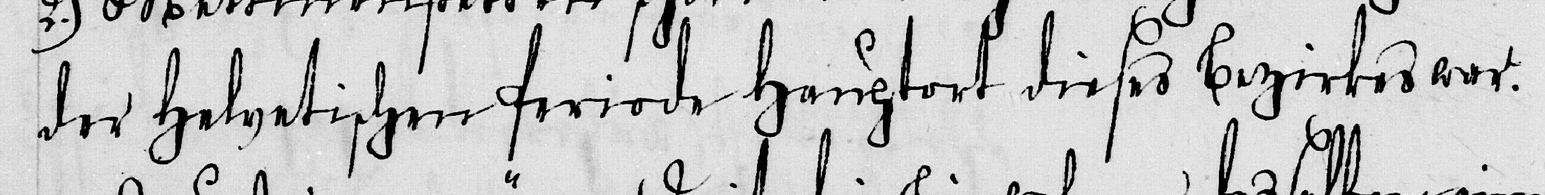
der Helvetischen Periode Hauptort dieses Bezirkes war.
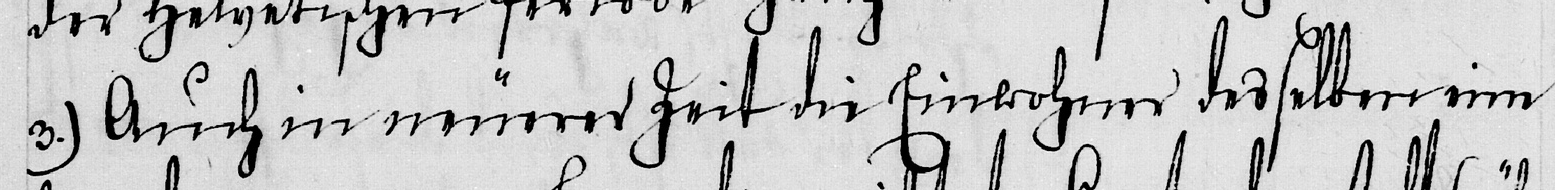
3.) Auch in neuerer Zeit die Einwohner desselben eine
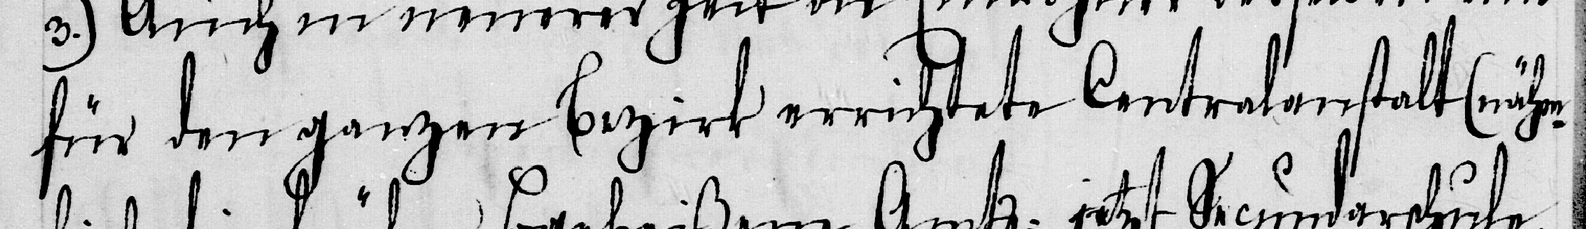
für den ganzen Bezirk errichtete Centralanstalt (näh¬
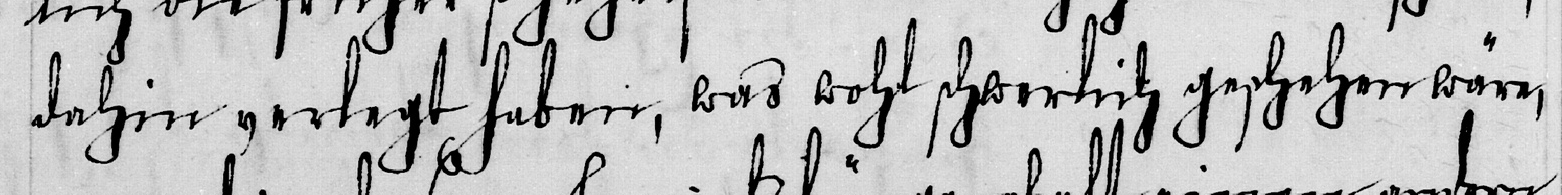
dahin verlegt haben, was wohl schwerlich geschehen wäre,
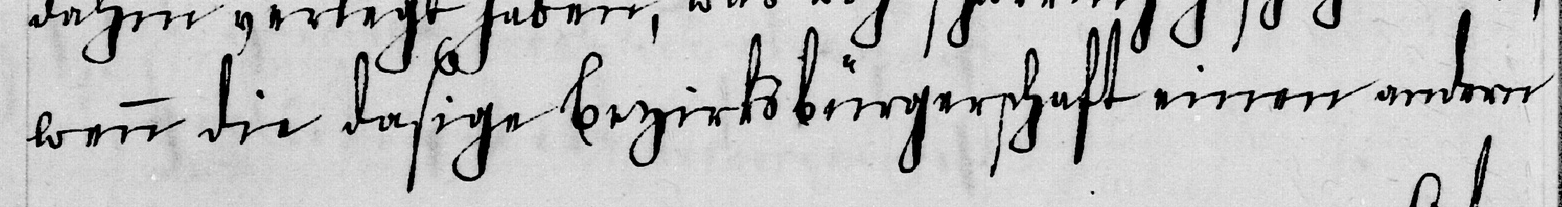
wenn die dasige Bezirksbürgerschaft einen andern
